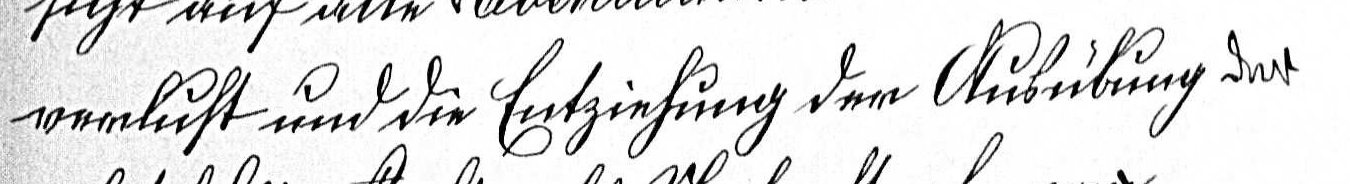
sverlust und die Entziehung der Ausübung der
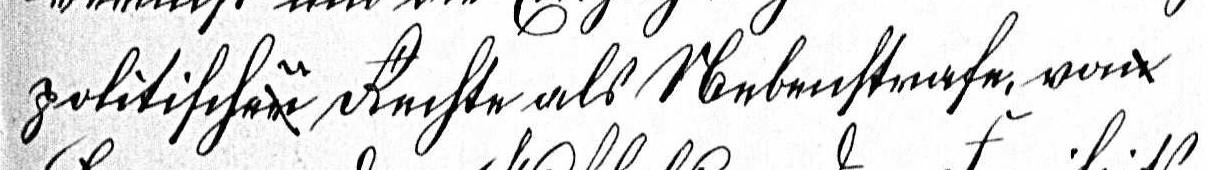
politischen Rechte als Nebenstrafe, von
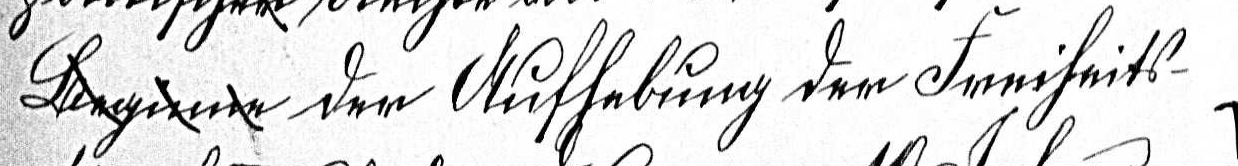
der Aufhebung der Freiheits¬
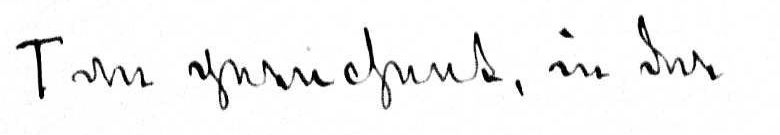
Tan gesuchent, in der
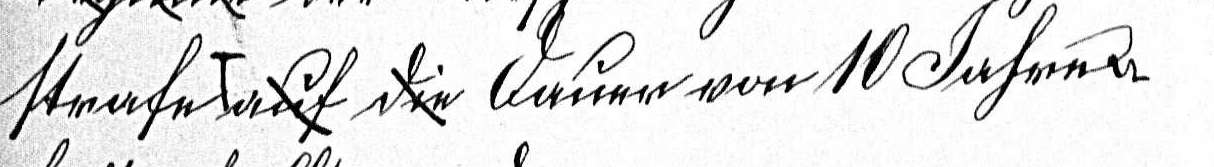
strafe an gerechnet, in der Dauer von 10 Jahren
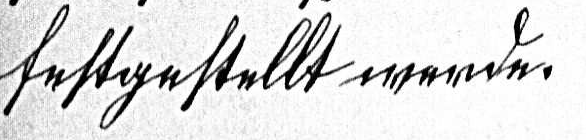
festgestellt werde.
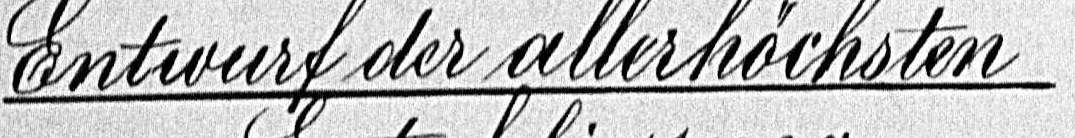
Entwurf der allerhöchsten
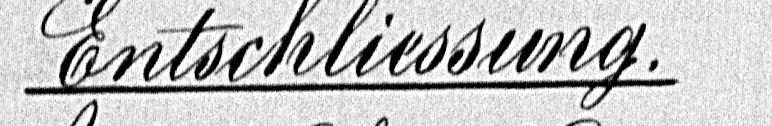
Entschliessung
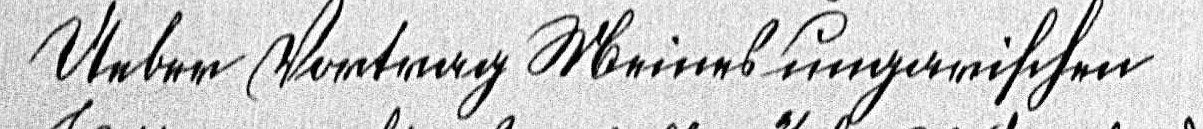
Ueber Vortrag Meines ungarischen
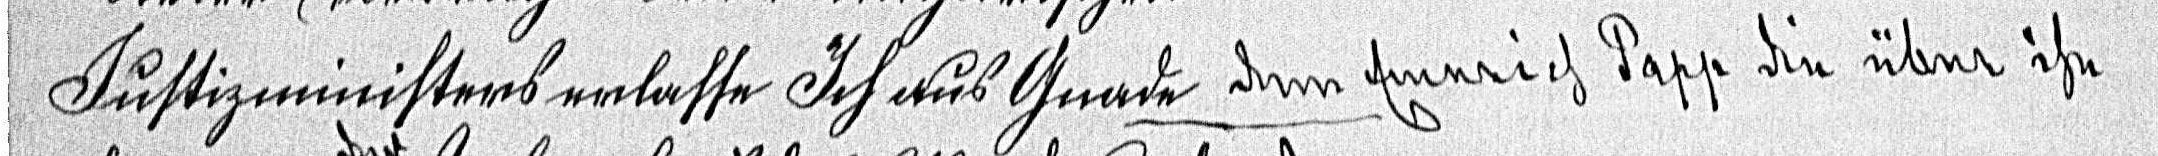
Justizministers erlasse Ich aus Gnade dem Emerich Papp die über ihn
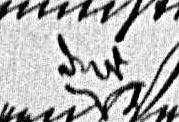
der
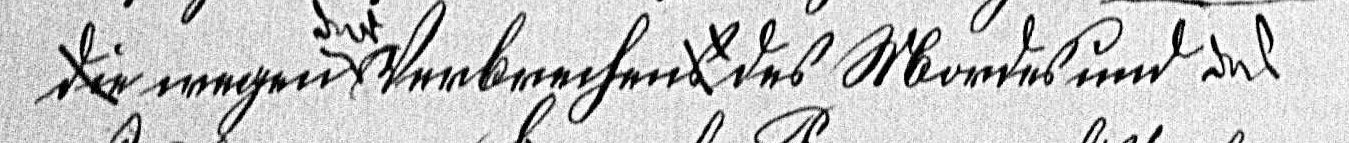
wegen Verbrechen des Mordes und des
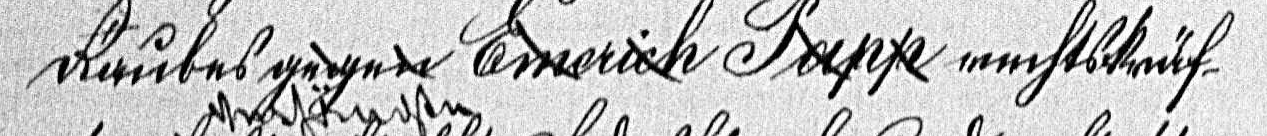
Raubes rechtskräf¬
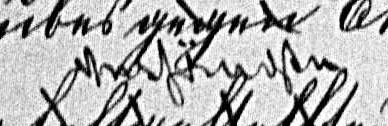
verhängte
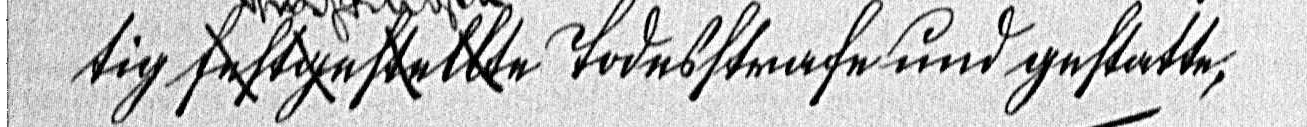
tig Todesstrafe und gestatte,
